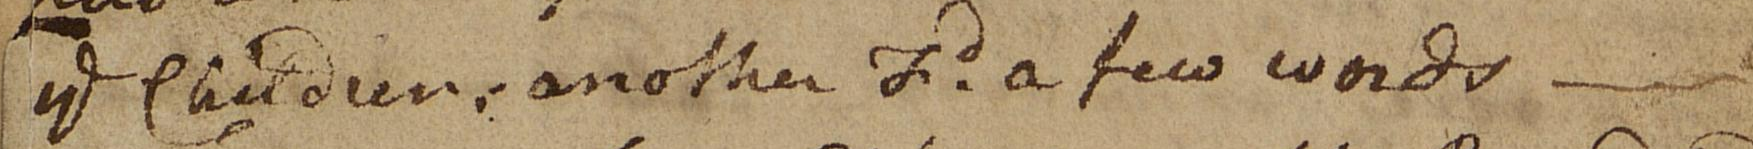y^e Children another F^d a few words-
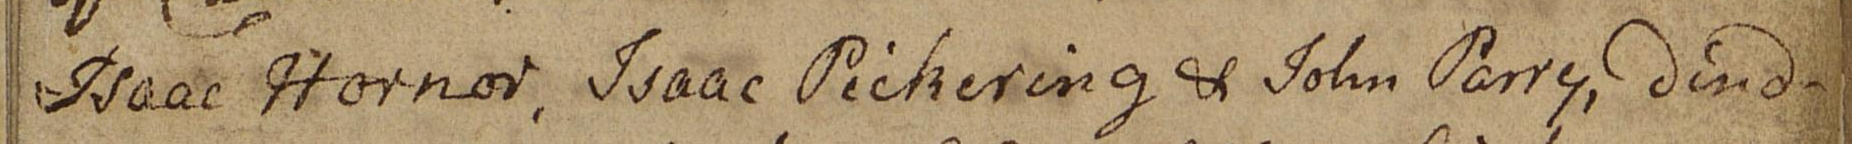Isaac Hornor, Isaac Pickering & John Parry, dind-
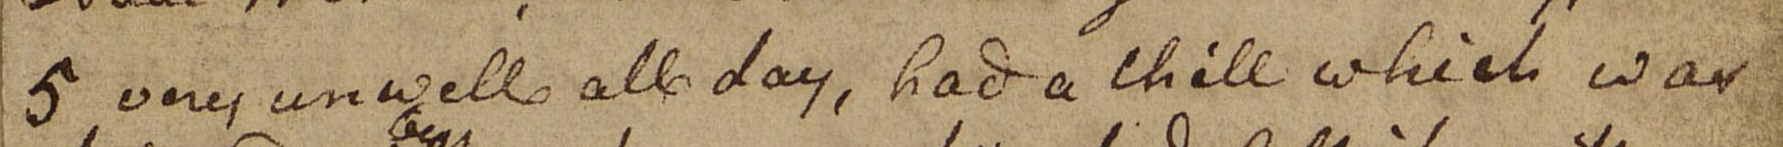5 very unwell all day, had a chill which was
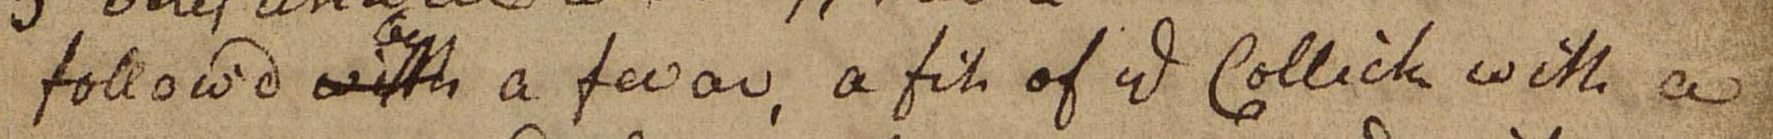follow'd with ^by a fevar a fit of y^e Collick with a
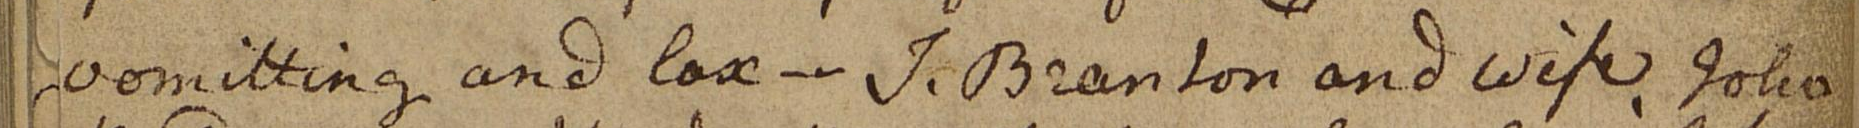vomitting and lax- J. Branton and wife Joln
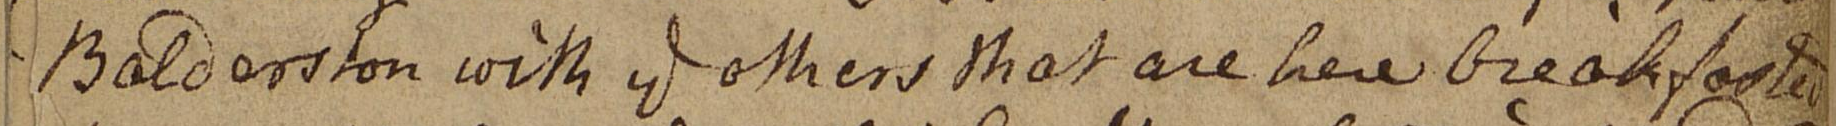Balderston with y^e others that are here breakfaste
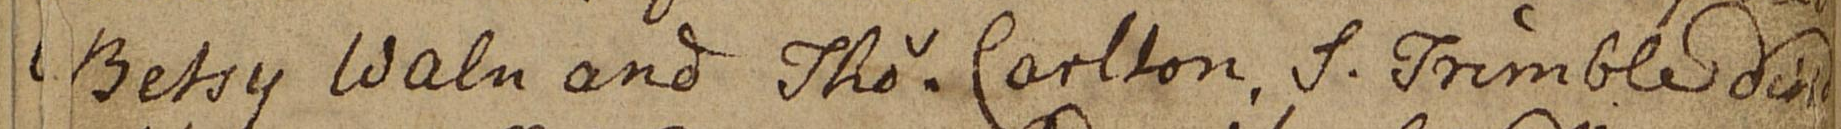Betsy Waln and Tho^s Carlton, S. Trimble dind
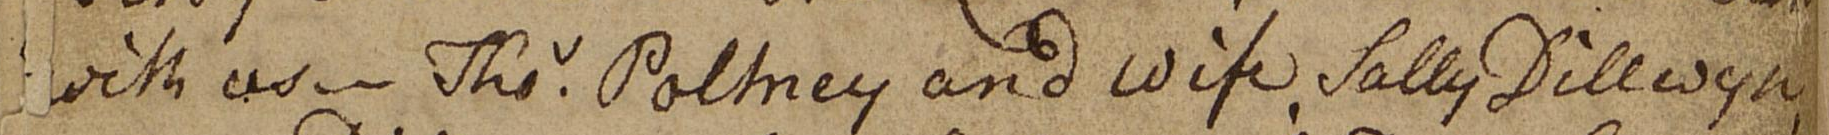with us- Tho^s Poltney and wife, Sally Dillwyn,
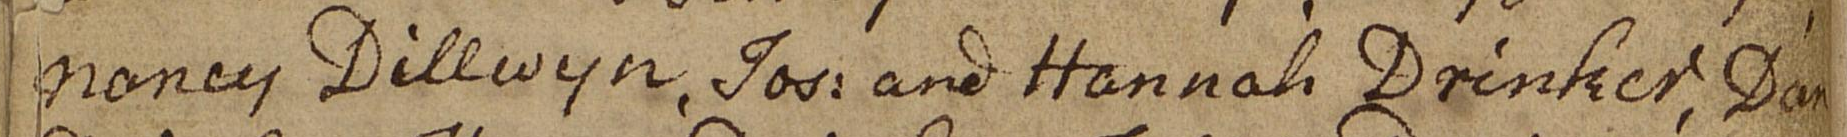Nancy Dillwyn, Jos: and Hannah Drinker, Dan
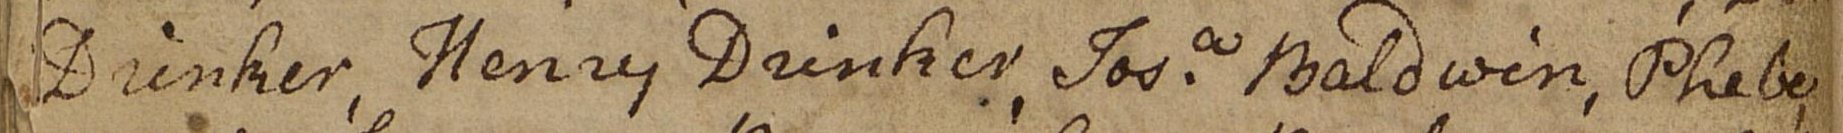Drinker, Henry Drinker, Jos^a. Bald win, Phebe
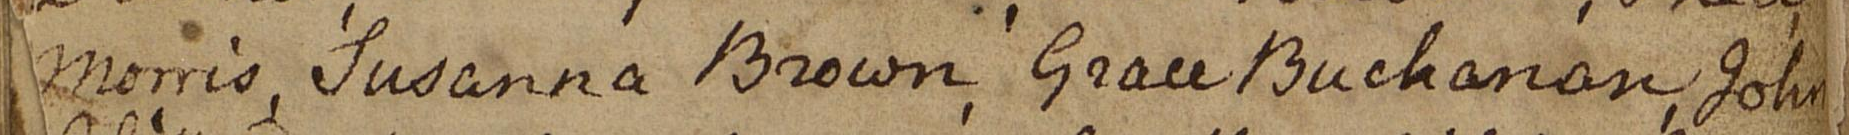Mnorris, Susanna Brown, Grace Buchanan, John
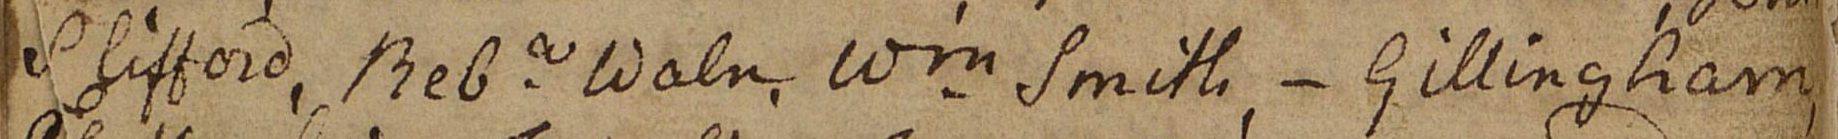Clifford, Reb^a. Waln, W^m Smith- Gillingham
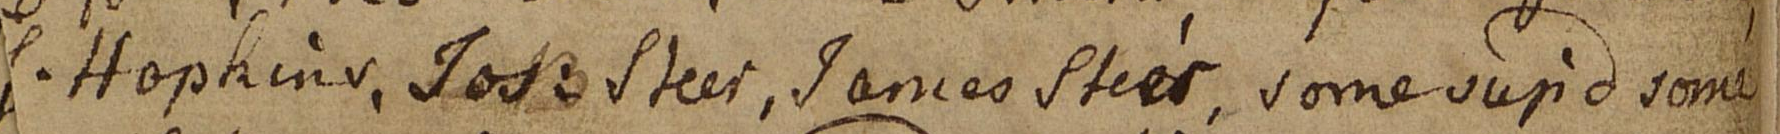Hopkins, Jos: Steer, James Steer, some sup'd some
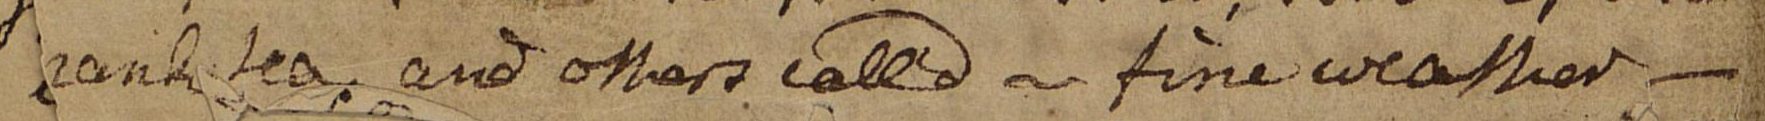rank tea and others call'd- fine weather-
